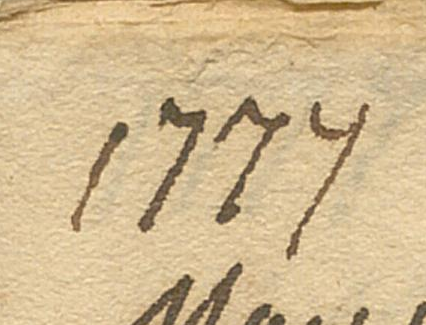1777
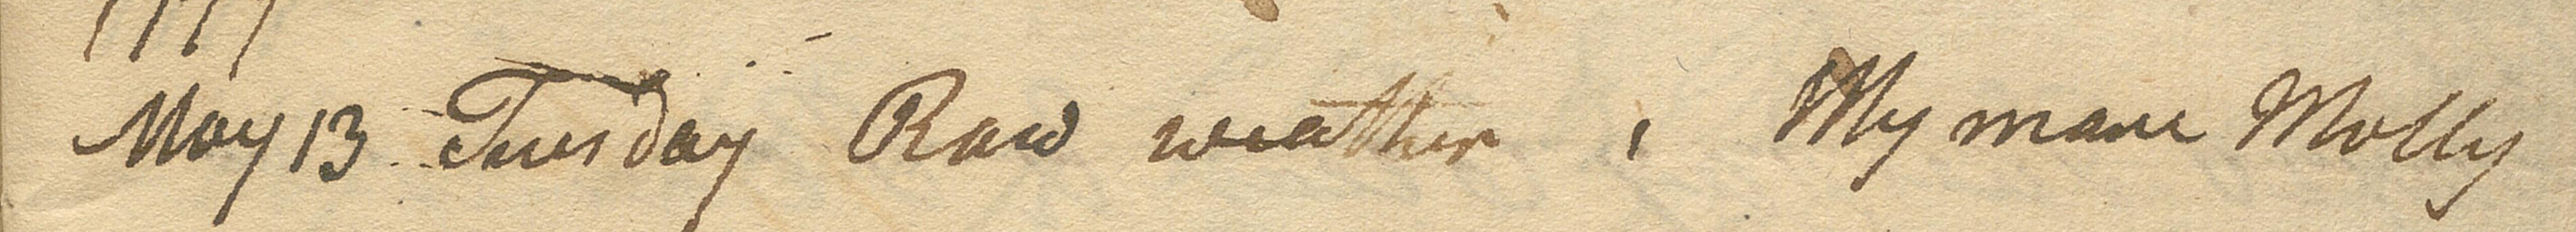May 13. Tuesday Raw weather. My mare Molly
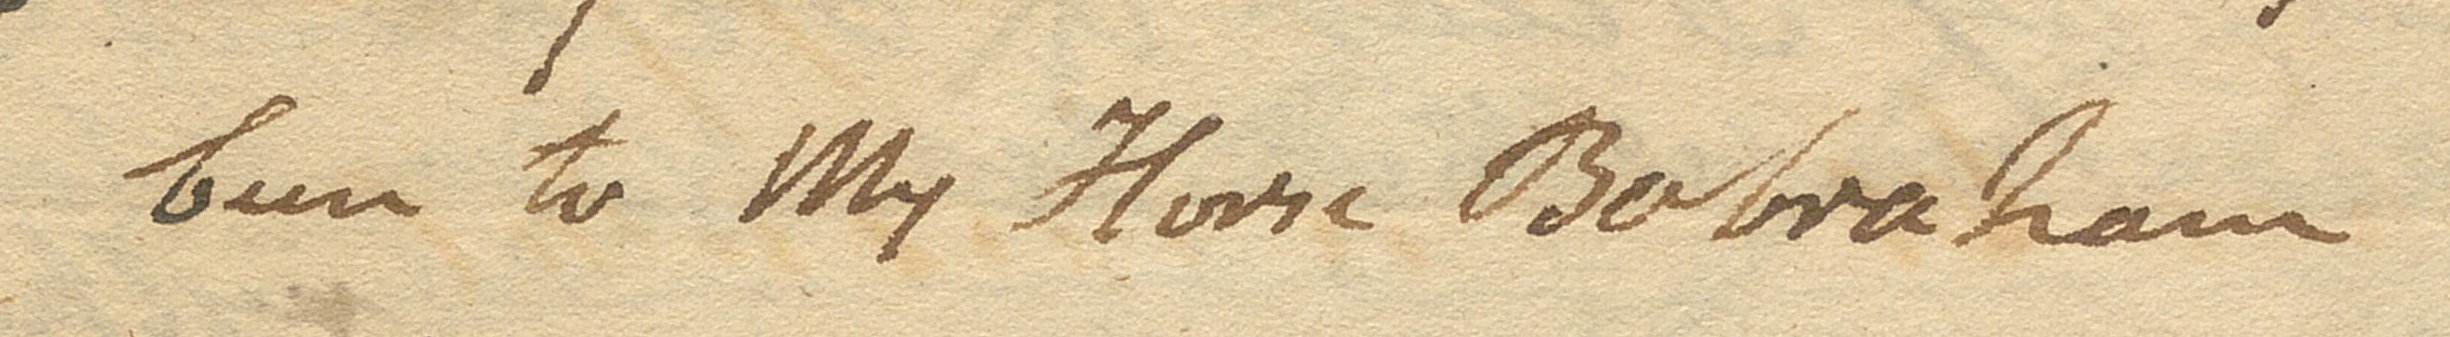been to My Horse Babraham
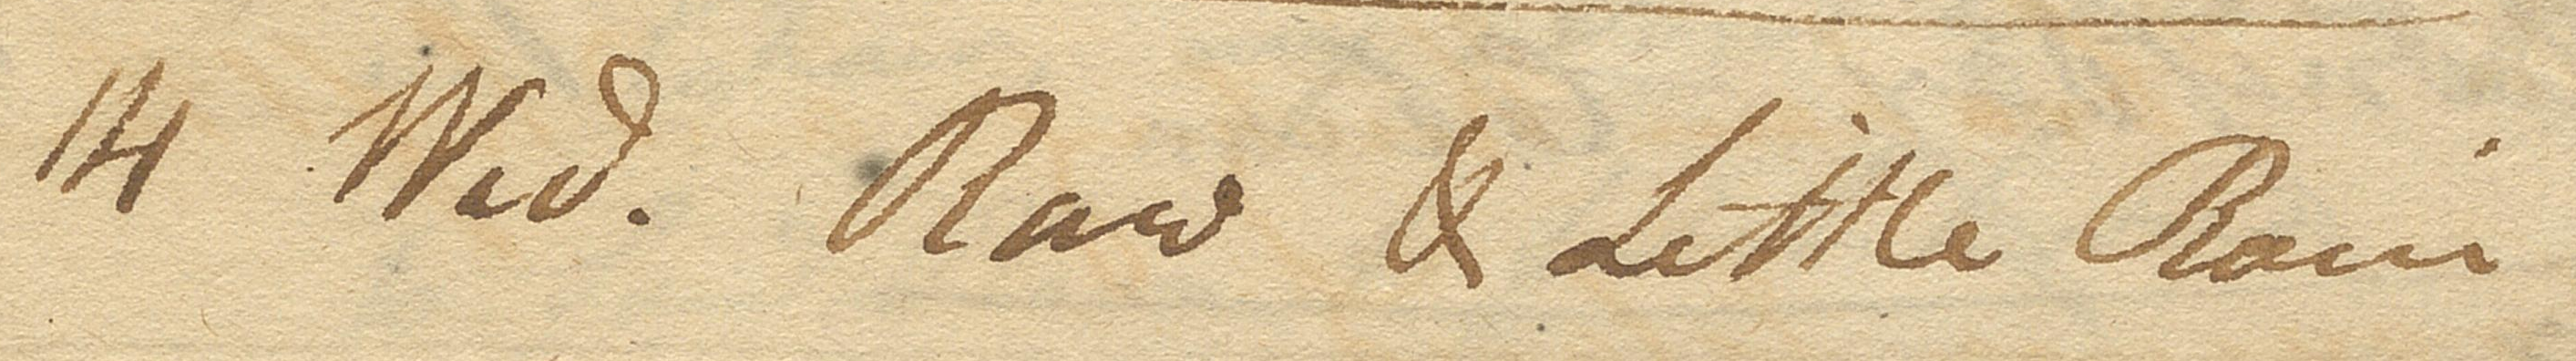14 Wed. Raw, & Little Rain
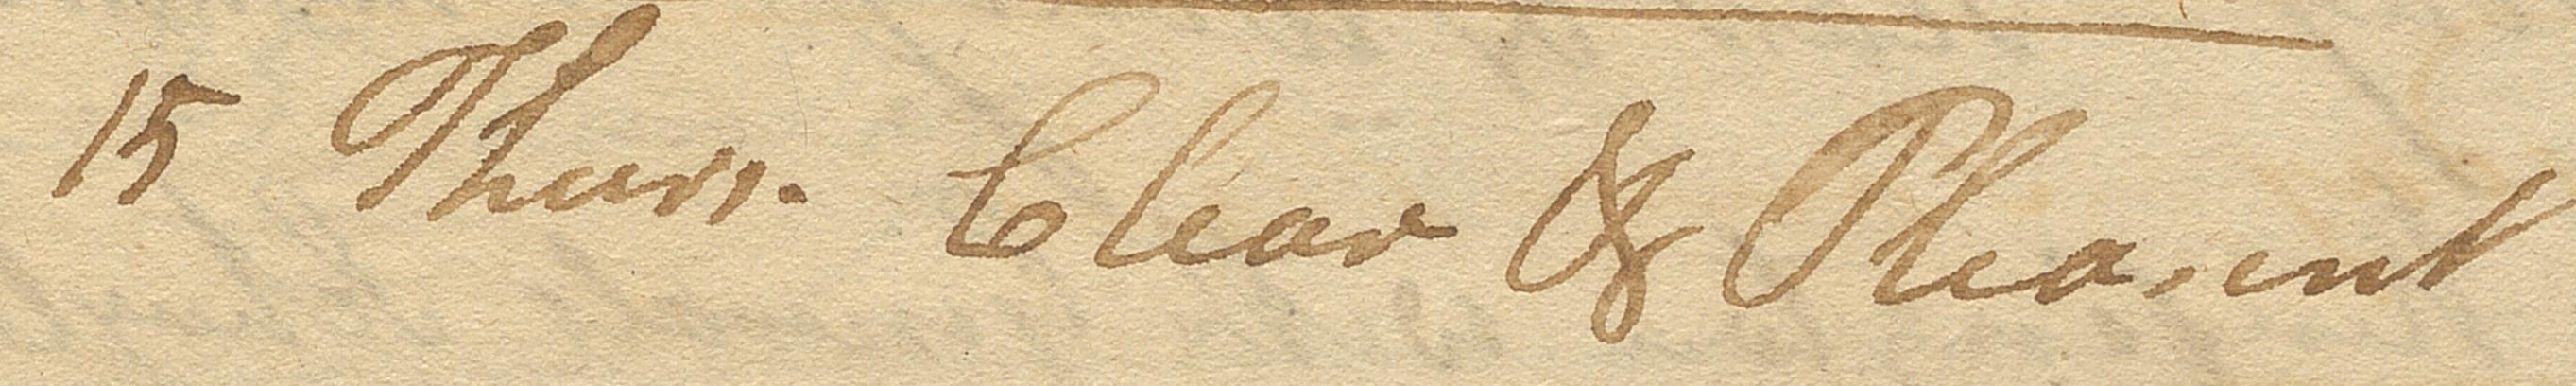15 Thurs. Clear & Pleasent
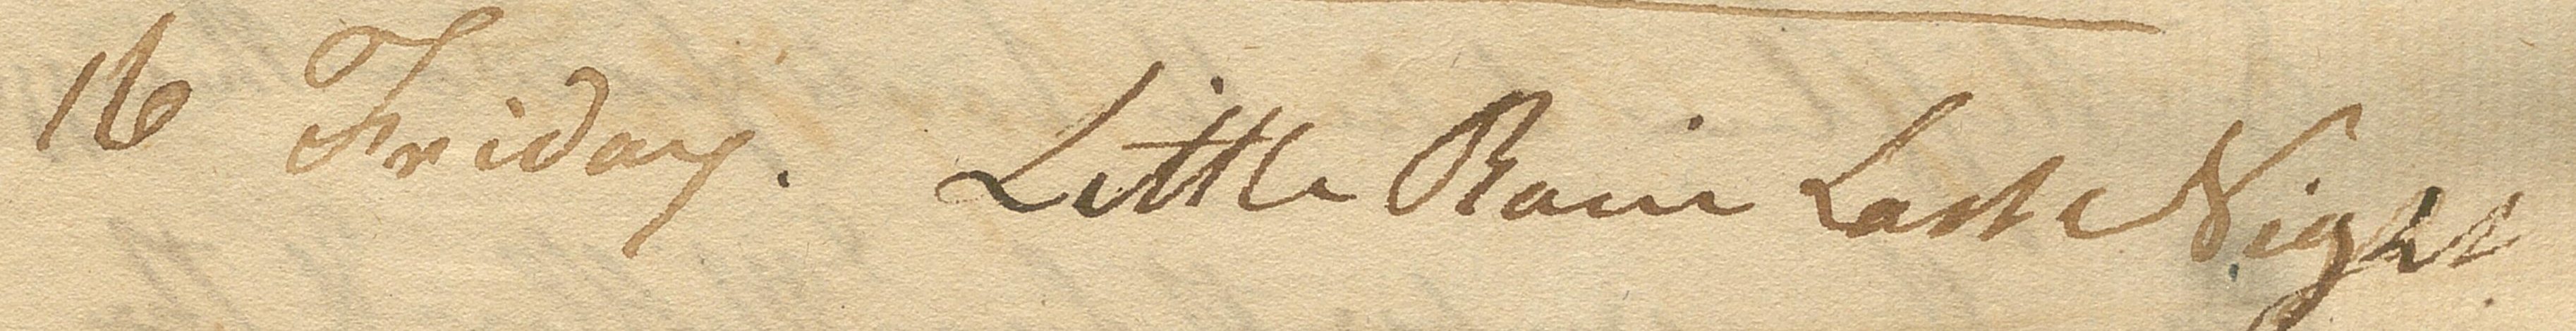16 Friday. Little Rain Last Night
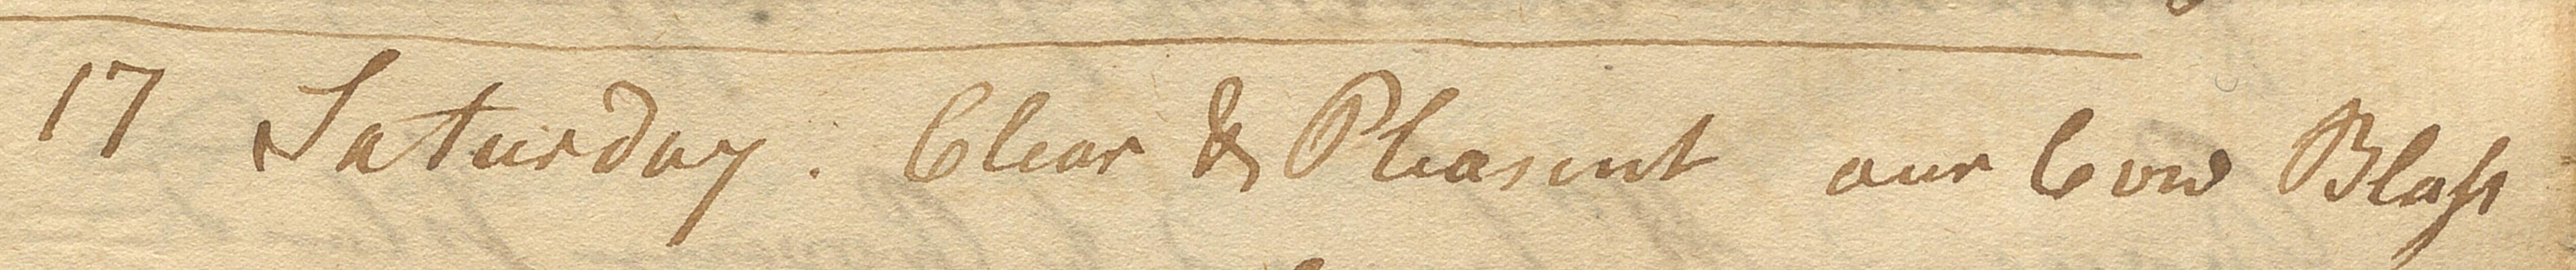17 Saturday. Clear & Pleasent our Cow Blass
